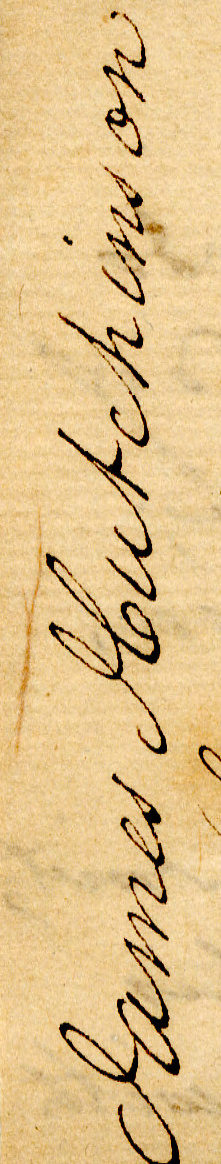James Hutchinson
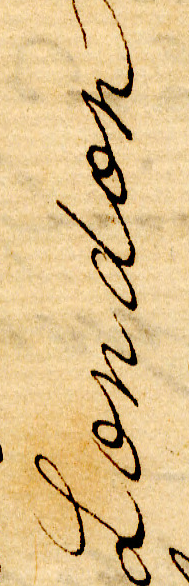London
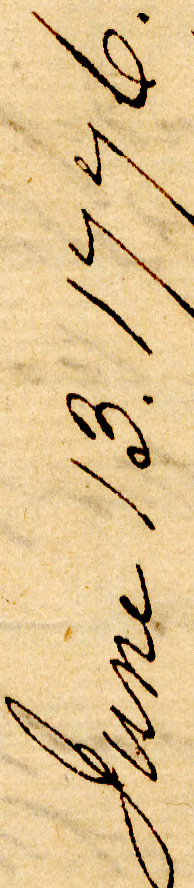June 13. 1776.
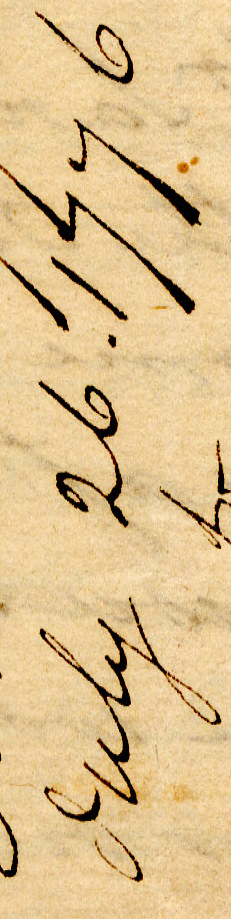July 26. 1776
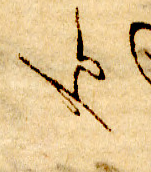to
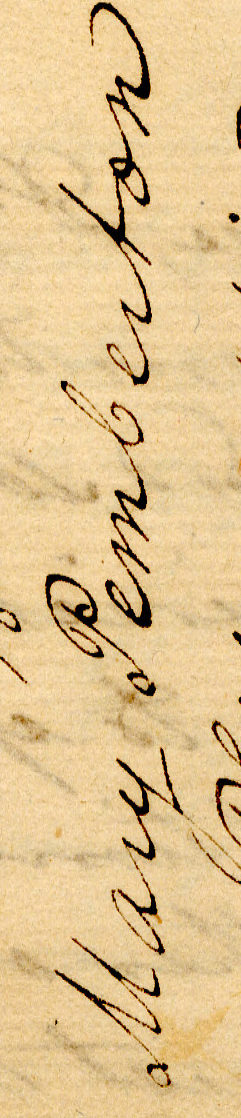Mary Pemberton
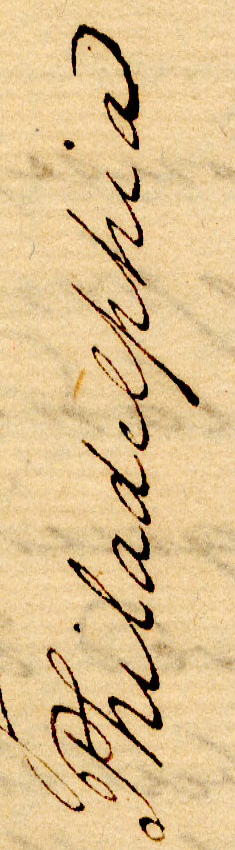Philadelphia
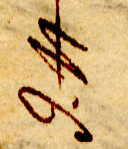J.H
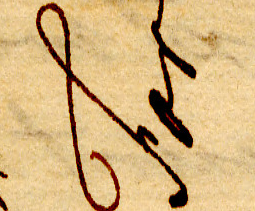For
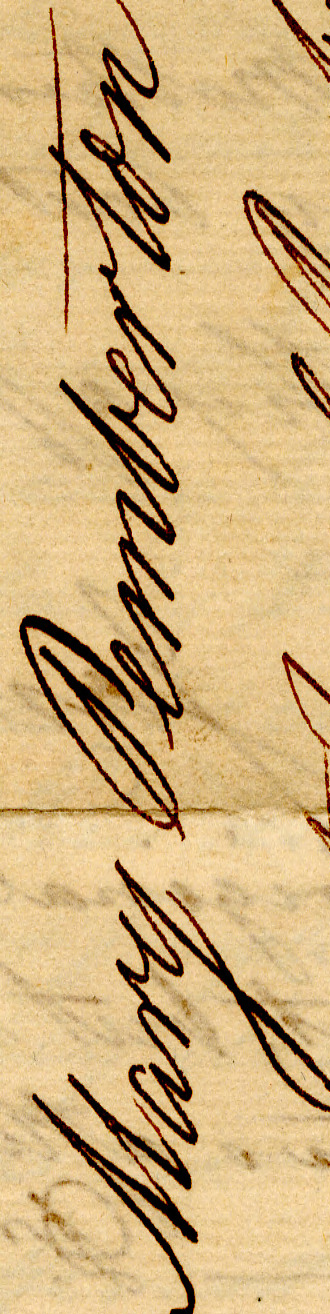Mary Pemberton
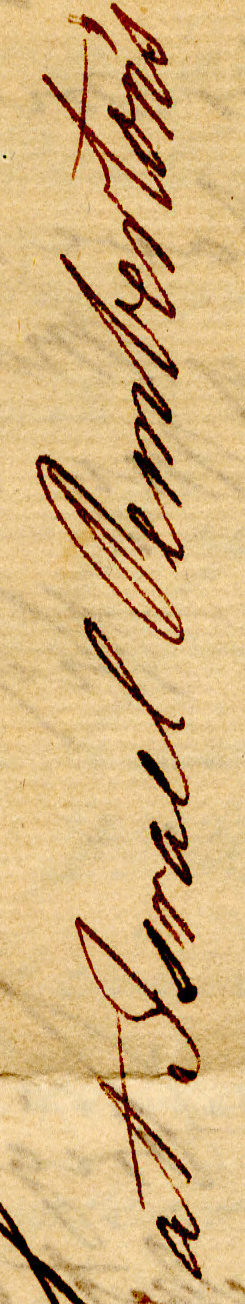at Israel Pemberton's
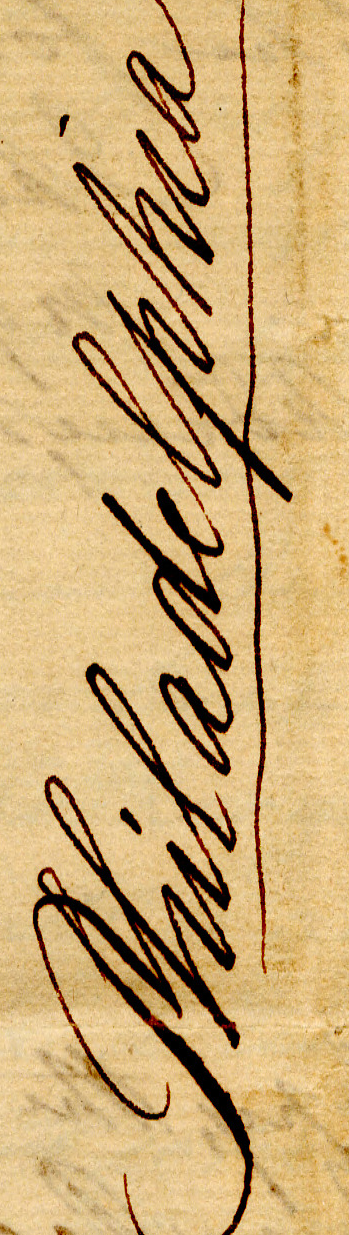Philadelphia
